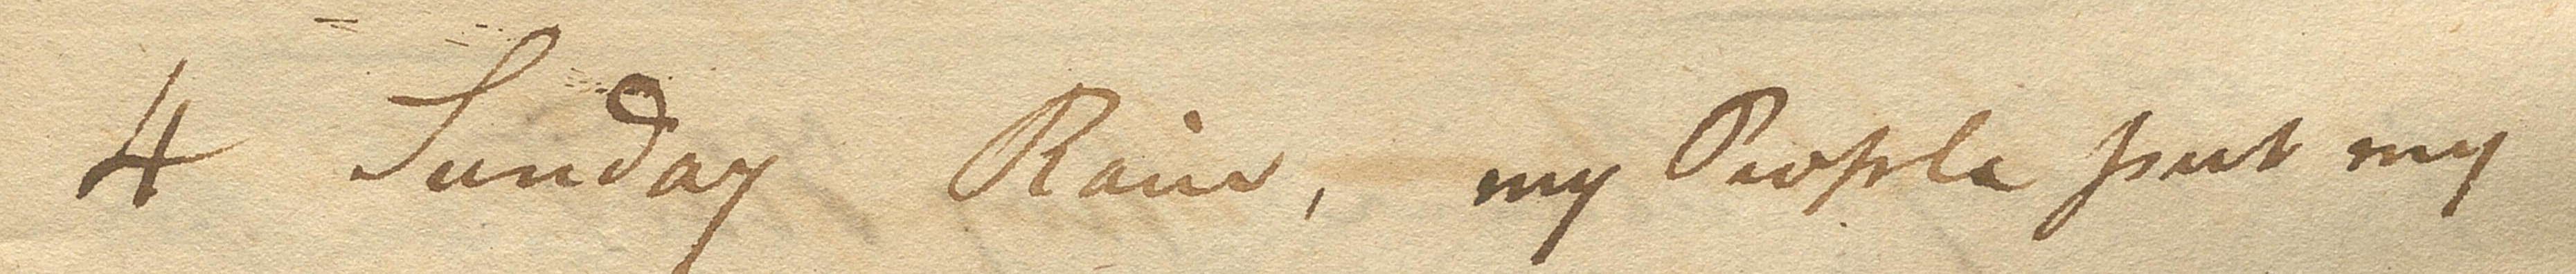4 Sunday Rain, my People put my
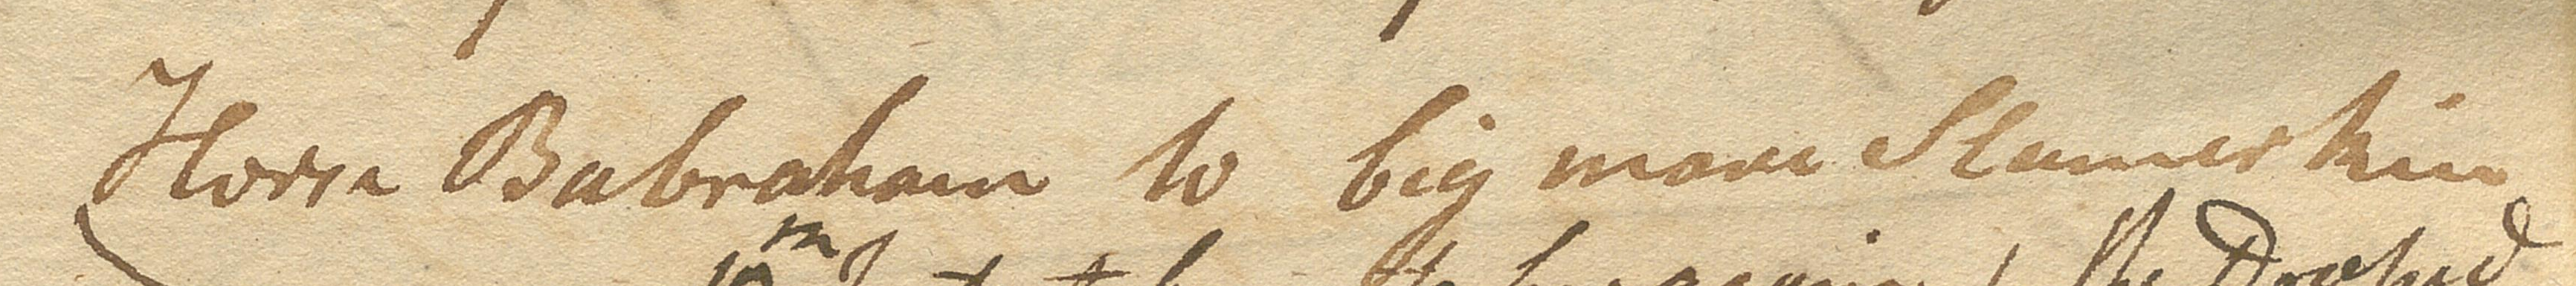Horse Babraham to big mare Slamerkin
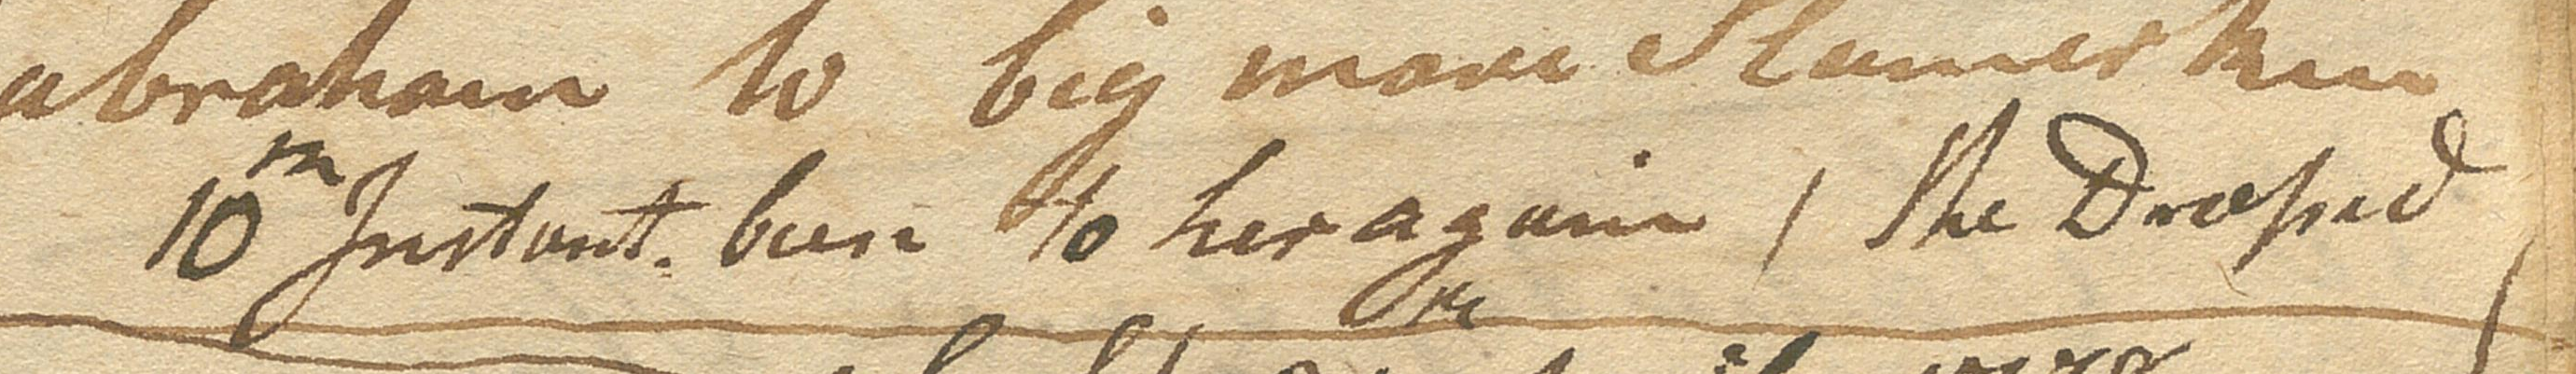10^th Instant. been to her again / the Droped
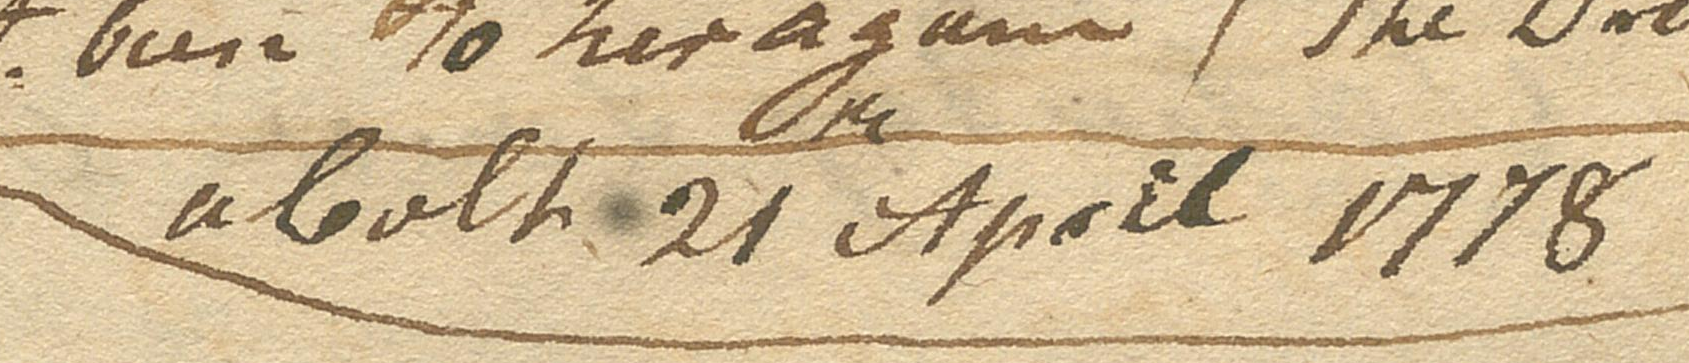aColt 21^th April 1778
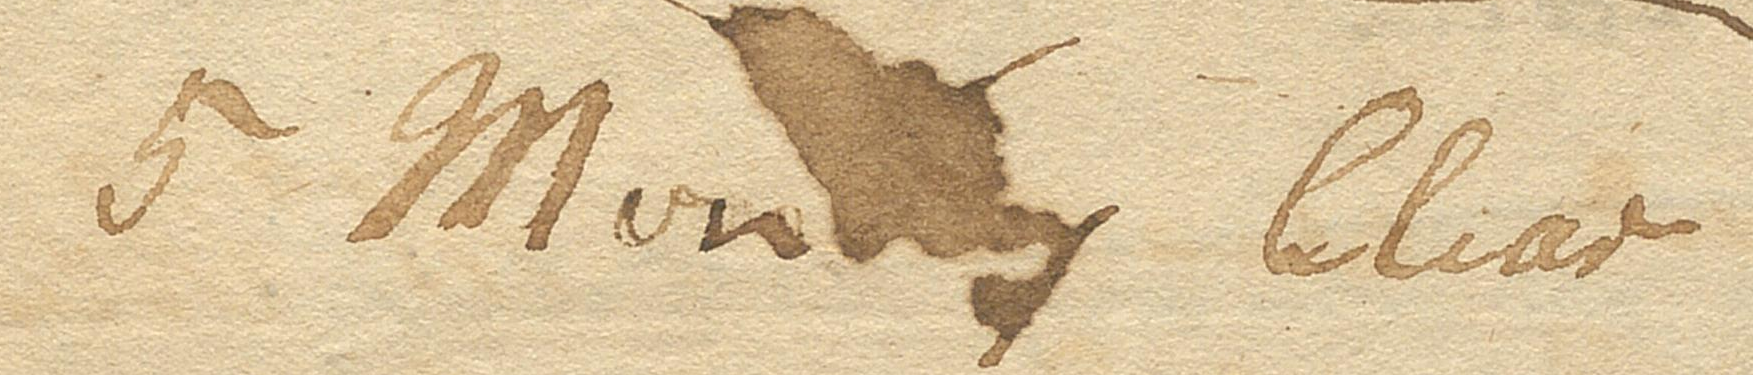3 Monday Clear
